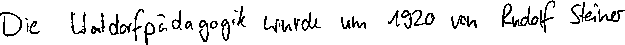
Die Waldorfpädagogik wurde um 1920 von Rudolf Steiner
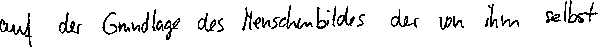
auf der Grundlage des Menschenbildes der von ihm selbst
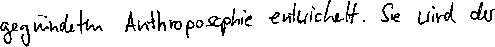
begründeten Anthroposophie entwickelt. Sie wird der
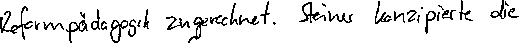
Reformpädagogik zugerechnet. Steiner konzipierte die
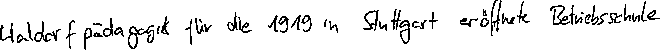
Waldorfpädagogik für die 1919 in Stuttgart eröffnete Betriebsschule
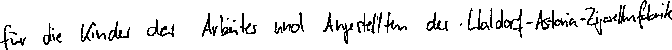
ür die Kinder der Arbeiter und Angestellten der Waldorf-Astoria-Zigarettenfabrik
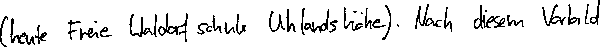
(heute Freie Waldorfschule Uhlandshöhe). Nach diesem Vorbild
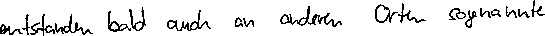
entstanden bald auch an anderen Orten sogenannte
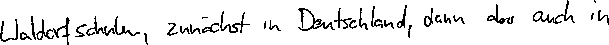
Waldorfschulen, zunächst in Deutschland, dann aber auch in
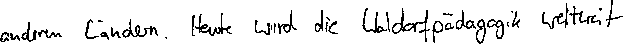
anderen Ländern. Heute wird die Waldorfpädagogik weltweit
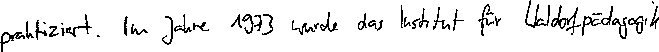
praktiziert. Im Jahre 1973 wurde das Institut für Waldorf-Pädagogik
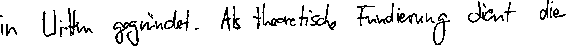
in Witten gegründet.Als theoretische Fundierung dient die
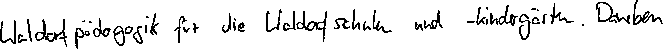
Waldorfpädagogik für die Waldorfschulen und -kindergärten. Daneben
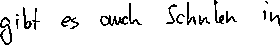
gibt es auch Schulen in
